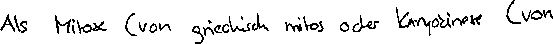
Als Mitose (von griechisch mitos oder Karyokinese (von
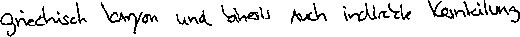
griechisch karyon und kinesis auch indirekte Kernteilung
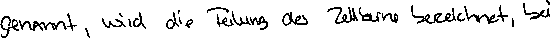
genannt, wird die Teilung des Zellkerns bezeichnet, bei
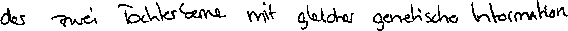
der zwei Tochterkerne mit gleicher genetischer Information
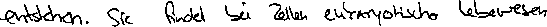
entstehen. Sie findet bei Zellen eukaryotischer Lebewesen
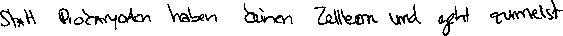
statt Prokaryoten haben keinen Zellkern und geht zumeist
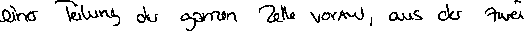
einer Teilung der ganzen Zelle voraus, aus der zwei
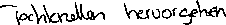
Tochterzellen hervorgehen
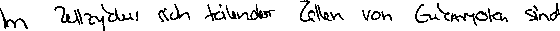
Im Zellzyklus sich teilender Zellen von Eukaryoten sind
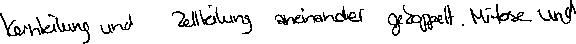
Kernteilung und Zellteilung aneinander gekoppelt. Mitose und
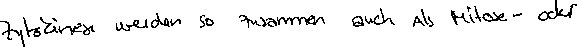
Zytokinese werden so zusammen auch als Mitose- oder
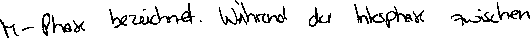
M-Phase bezeichnet. Während der Interphase zwischen
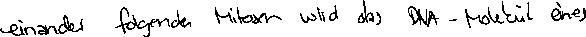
einander folgenden Mitosen wird das DNA-Molekül eines
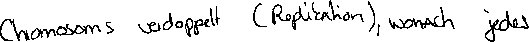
Chromosoms verdoppelt (Replikation), wonach jedes
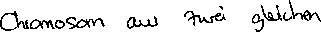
Chromosom aus zwei gleichen
